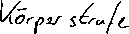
Körperstrafe
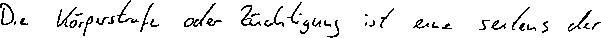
Die Körperstrafe oder Züchtigung ist eine seitens der
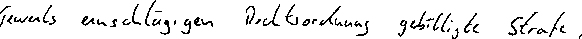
jeweils einschlägigen Rechtsordnung gebilligte Strafe,
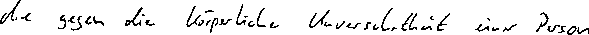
die gegen die körperliche Unversehrtheit einer Person
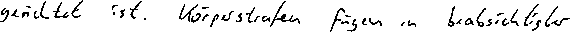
gerichtet ist. Körperstrafen fügen in beabsichtigter
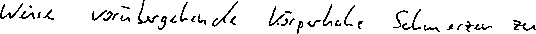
Weise vorübergehende körperliche Schmerzen zu.
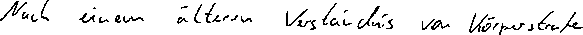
Nach einem älteren Verständnis von Körperstrafe
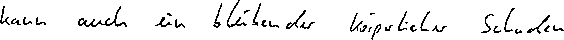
kann auch ein bleibender körperlicher Schaden
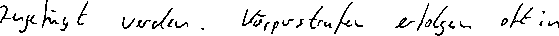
zugefügt werden. Körperstrafen erfolgen oft in
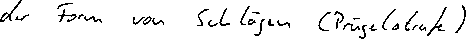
der Form von Schlägen (Prügelstrafe)
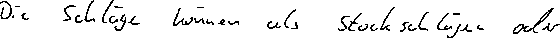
Die Schläge können als Stockschläge oder
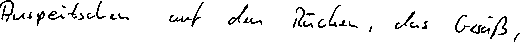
Auspeitschen auf den Rücken, das Gesäß,
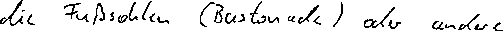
die Fußsohlen (Bastonade) oder andere
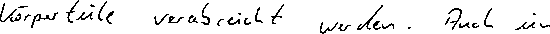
Körperteile verabreicht werden. Auch ein
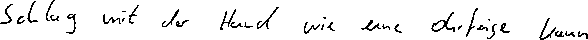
Schlag mit der Hand wie eine Ohrfeige kann
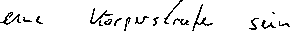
eine Körperstrafe sein.
